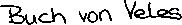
Buch von Veles
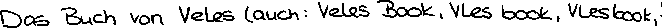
Das Buch von Veles (auch: Veles Book, Vles book, Vlesbook,
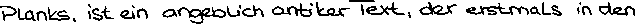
Planks, ist ein angeblich antiker Text, der erstmals in den
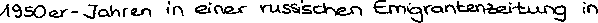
1950er-Jahren in einer russischen Emigrantenzeitung in
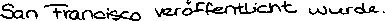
San Francisco veröffentlicht wurde.
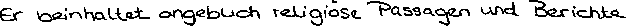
Er beinhaltet angeblich religiöse Passagen und Berichte
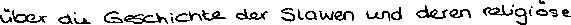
über die Geschichte der Slawen und deren religiöse
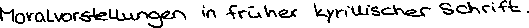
Moralvorstellungen in früher kyrillischer Schrift.
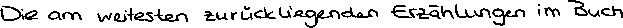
Die am weitesten zurückliegenden Erzählungen im Buch
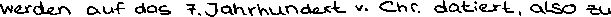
werden auf das 7. Jahrhundert v. Chr. datiert, also zu
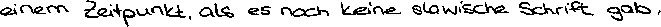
einem Zeitpunkt, als es noch keine slawische Schrift gab,
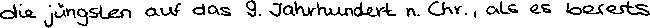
die jüngsten auf das 9. Jahrhundert n. Chr., als es bereits
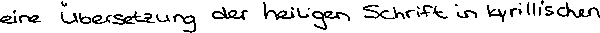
eine Übersetzung der heiligen Schrift in kyrillischen
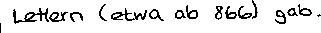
Lettern (etwa ab 866) gab.
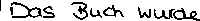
Das Buch wurde
